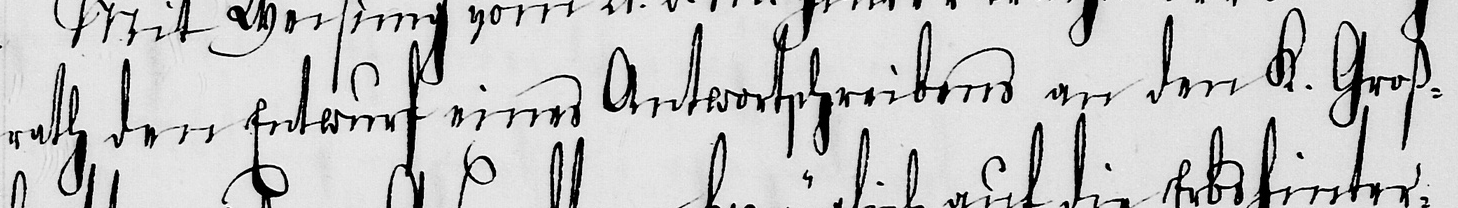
ath den Entwurf eines Antwortschreibens an den K. Groß¬
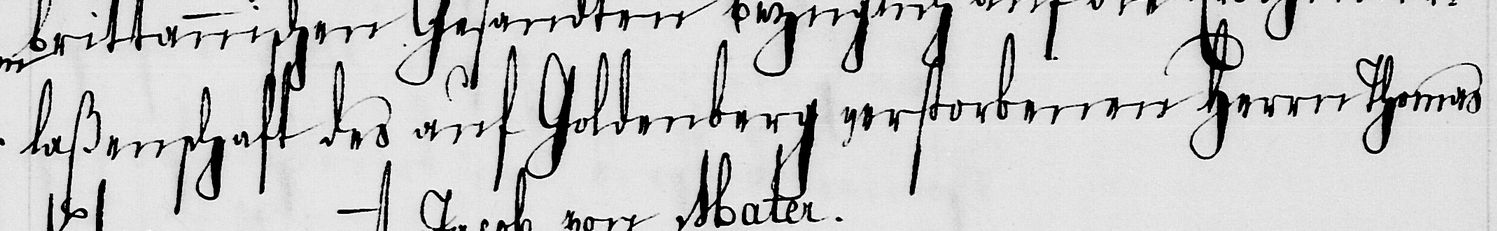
laßenschaft des auf Goldenberg verstorbenen Herrn Thomas
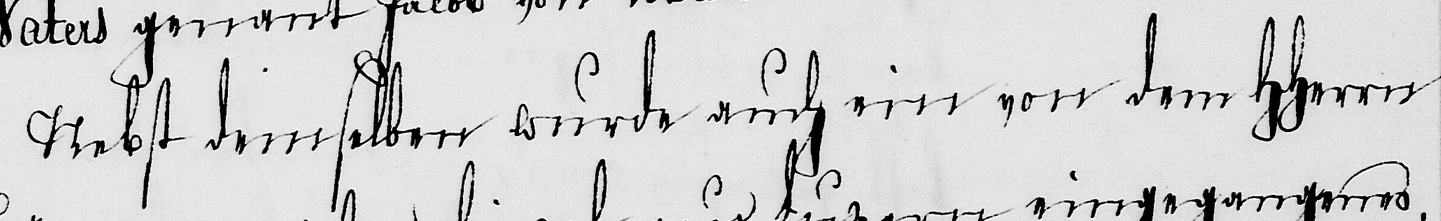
Nebst demselben wurde auch ein von dem HHerrn
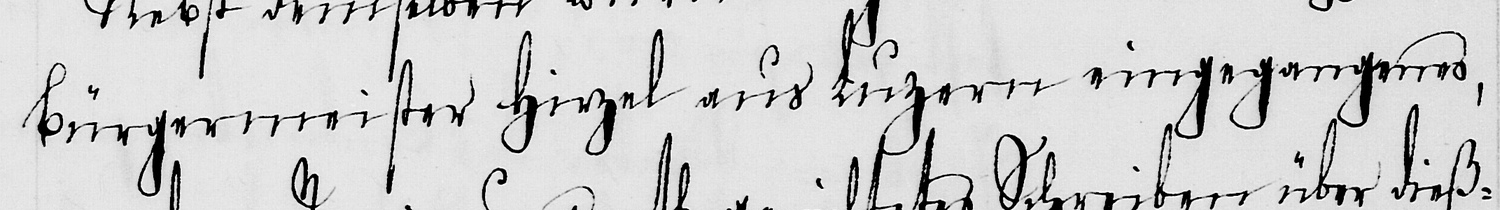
Bürgermeister Hirzel aus Luzern eingegangenes,
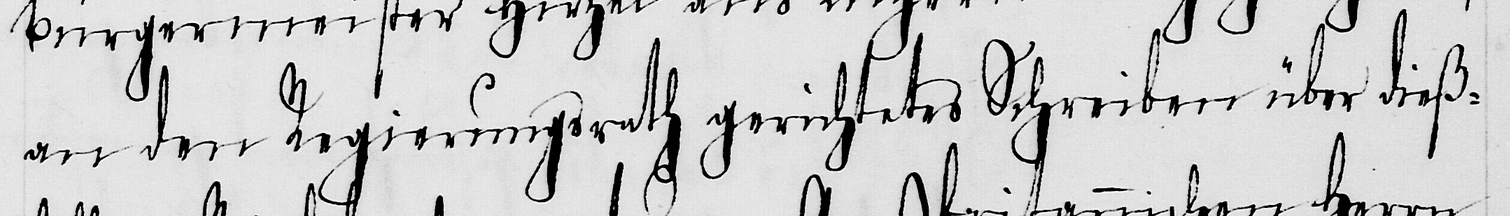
an den Regierungsrath gerichtetes Schreiben über dieß¬
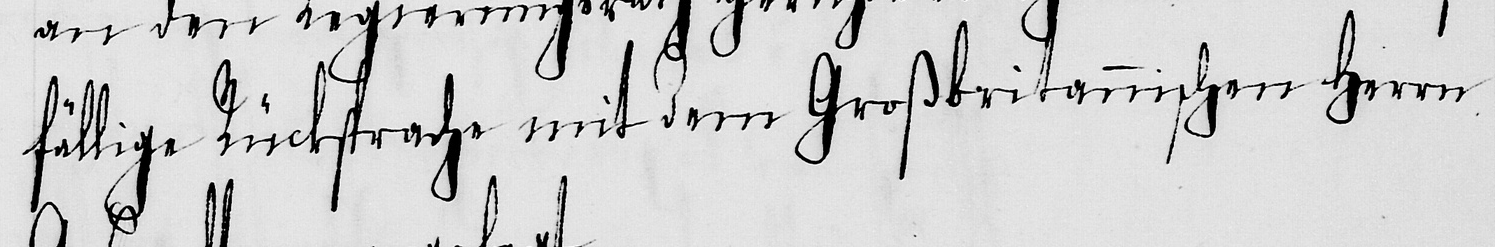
fällige Rücksprache mit dem Großbritannischen Herrn
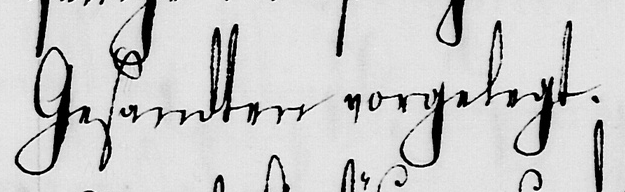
Gesandten vorgelegt.
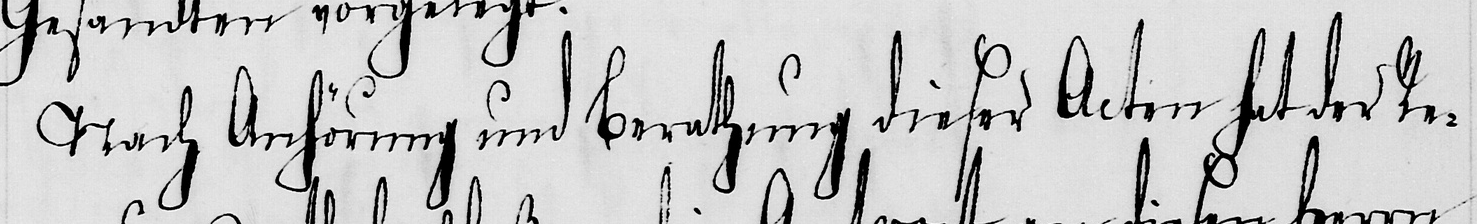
Nach Anhörung und Berathung dieser Acten hat der Re¬
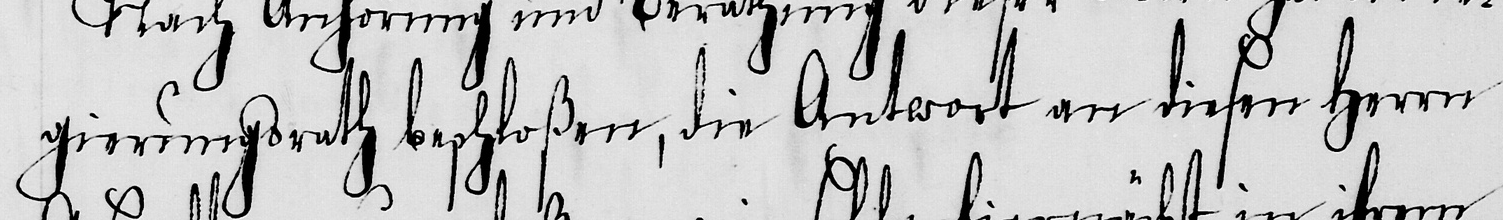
gierungsrath beschloßen, die Antwort an diesen Herrn
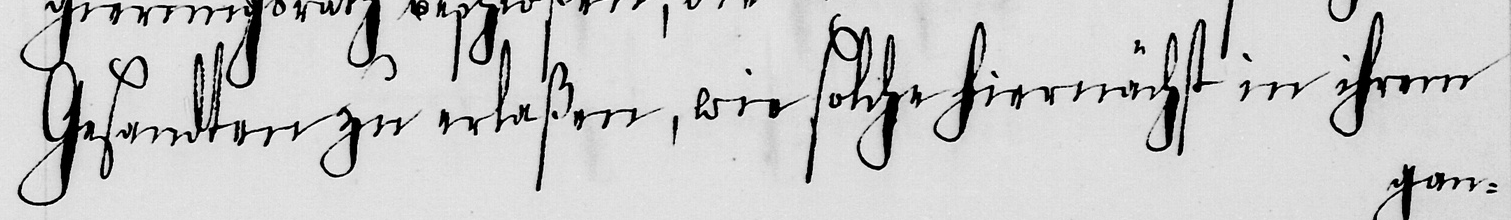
Gesandten zu erlaßen, wie solche hiernächst in ihrem
